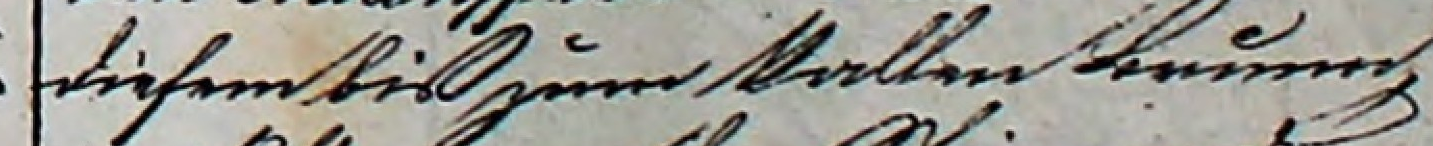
diesem bis zum kallen Brunn
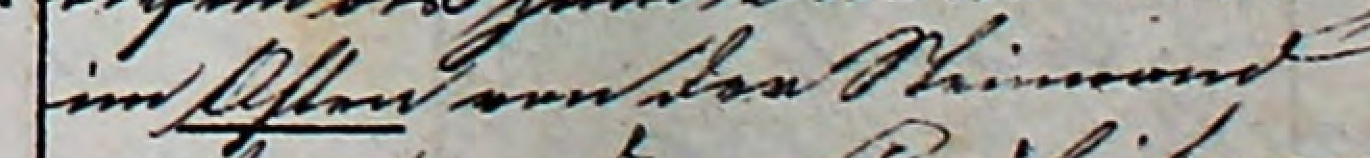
im Osten von der Stei???nd
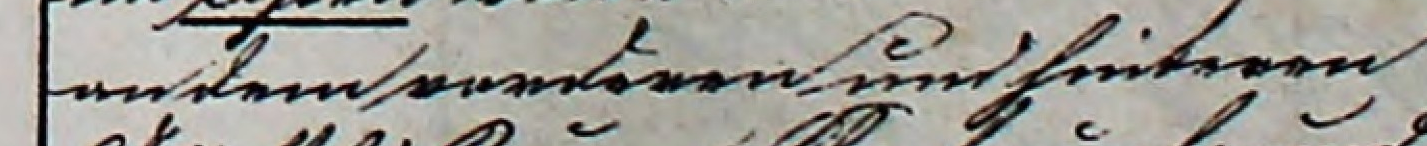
an dem vorderen und hinteren
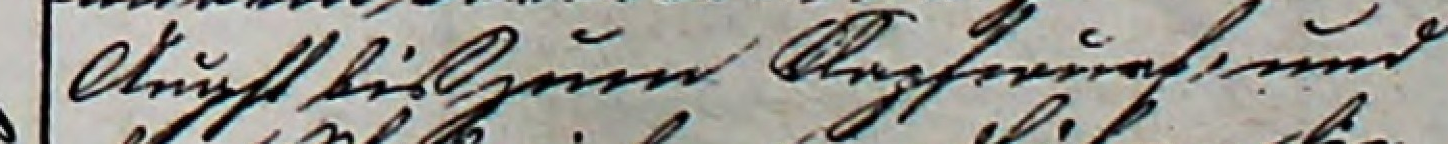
Augst bis zum Klapswurf, und
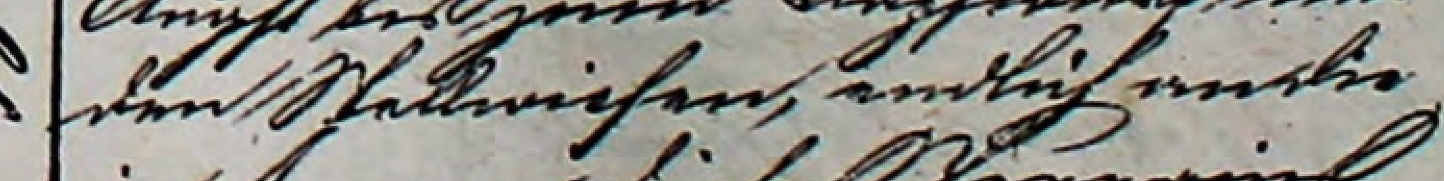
den Stellwiesen, endlich an die
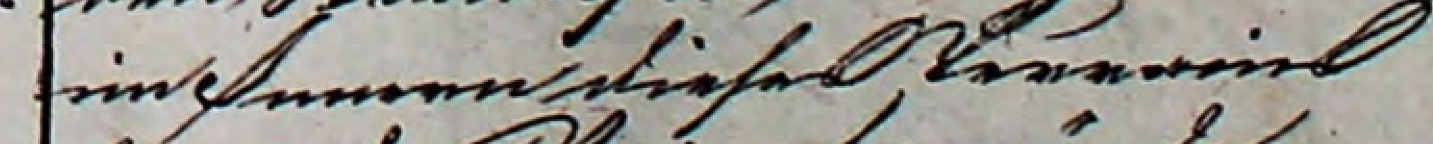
in Innern dieses Terrains
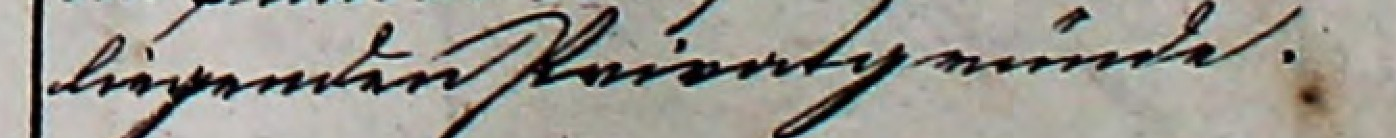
liegenden Privatgründe.
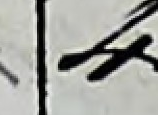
4
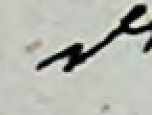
do
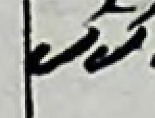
55
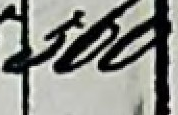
560
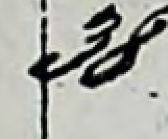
38
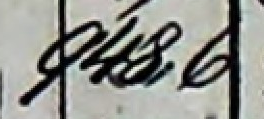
948,6
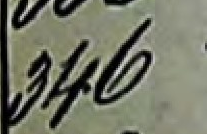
346
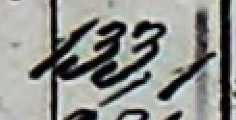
233
